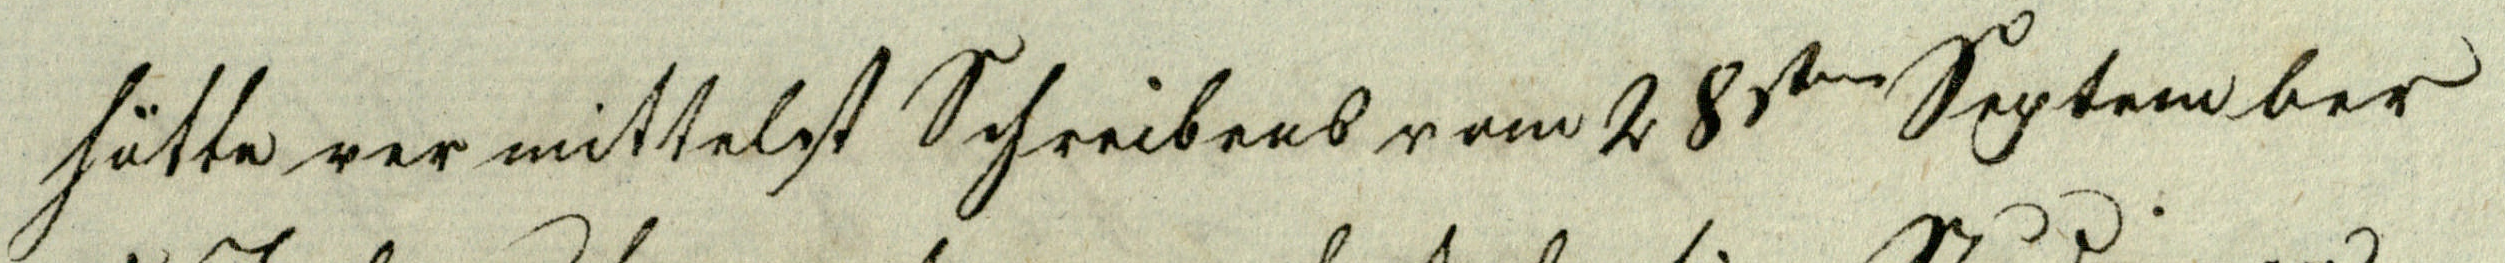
hätte vermittelst Schreibens vom 28ten September
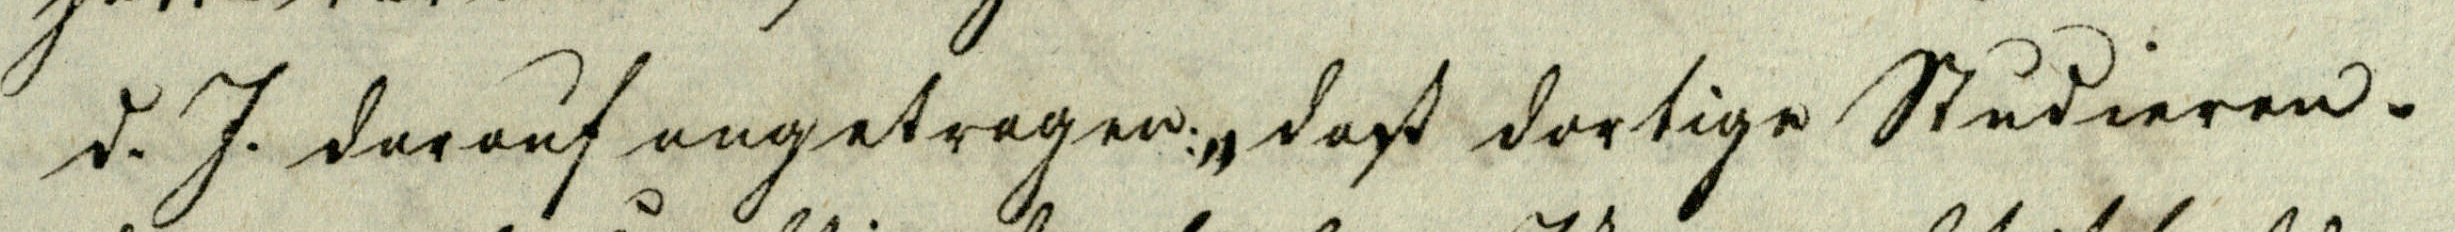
d. J. darauf angetragen:" daß dortige Studieren¬
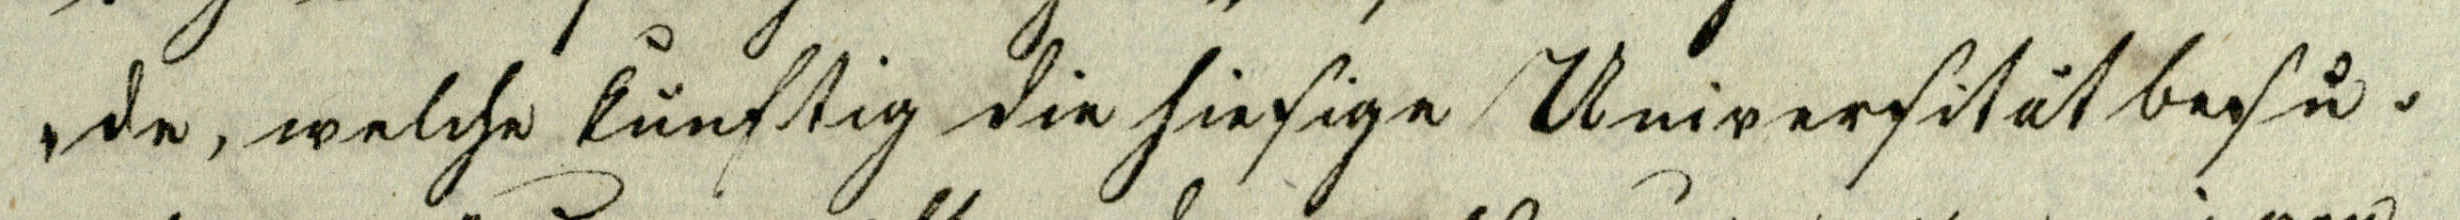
de, welche künftig die hiesige Universität besu¬
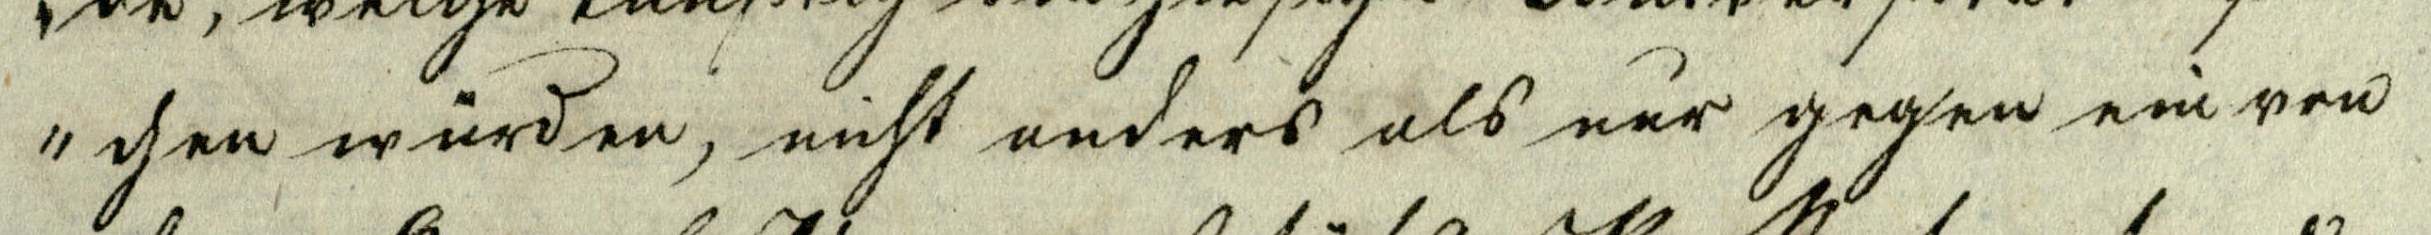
chen würden, nicht anders als nur gegen ein von
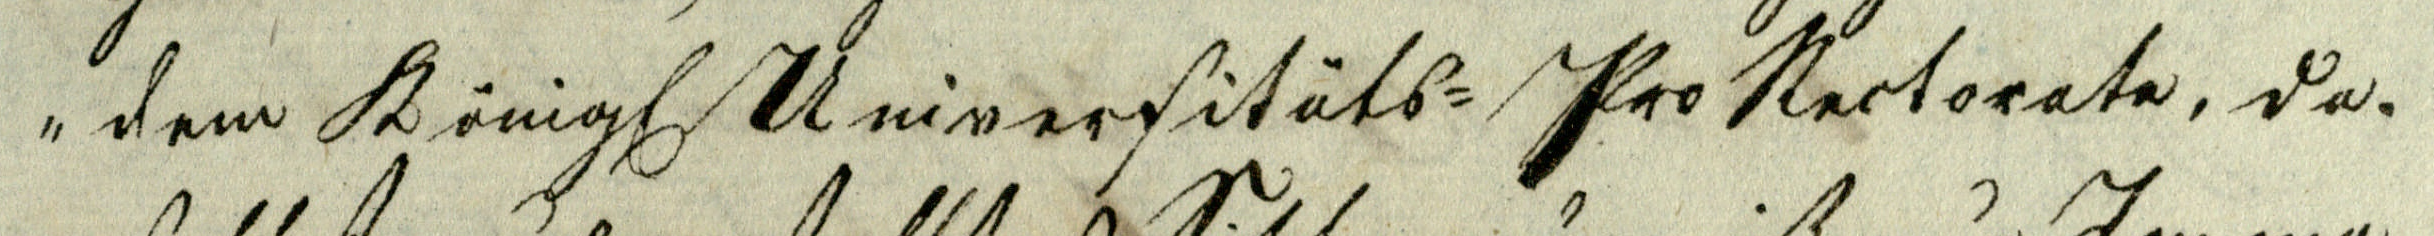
dem Königl. Universitäts-ProRectorate, da¬
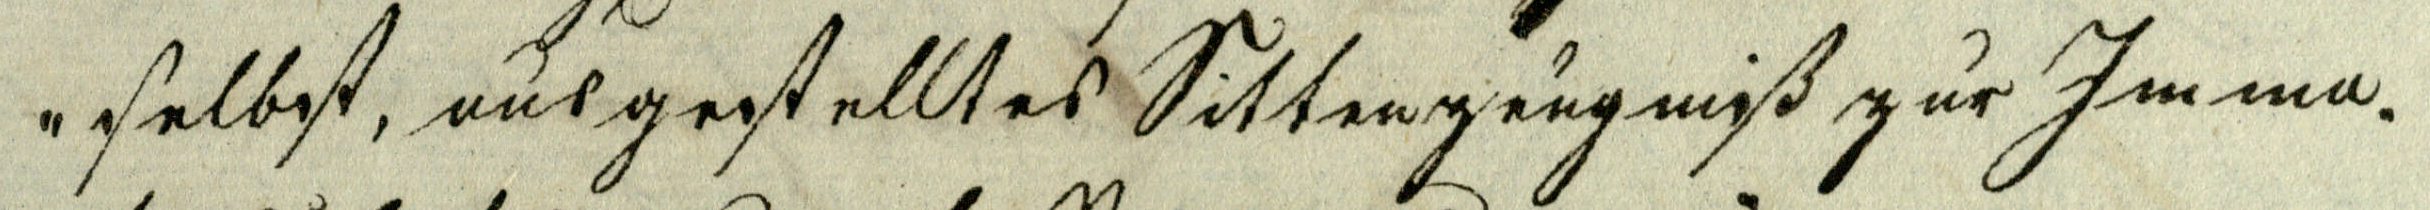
selbst, ausgestelltes Sittenzeugniß zur Imma¬
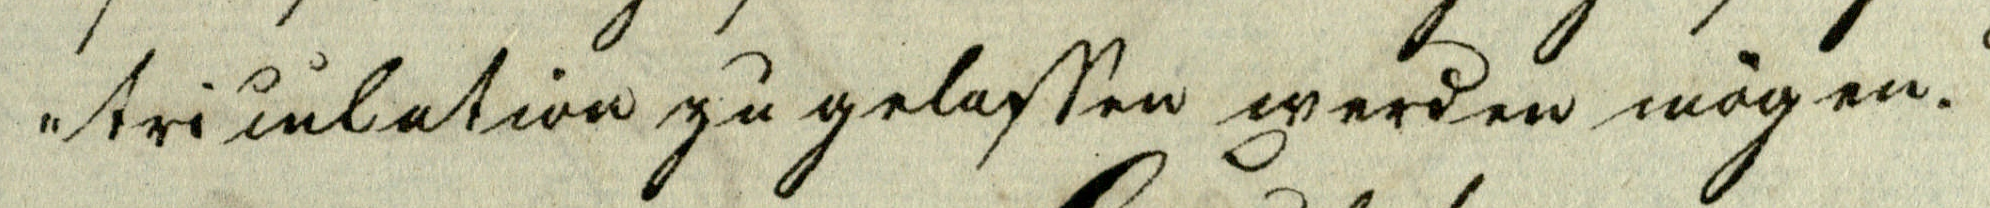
triculation zu gelassen werden mögen.
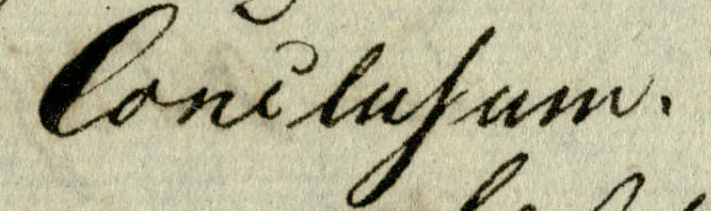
Conclusum:
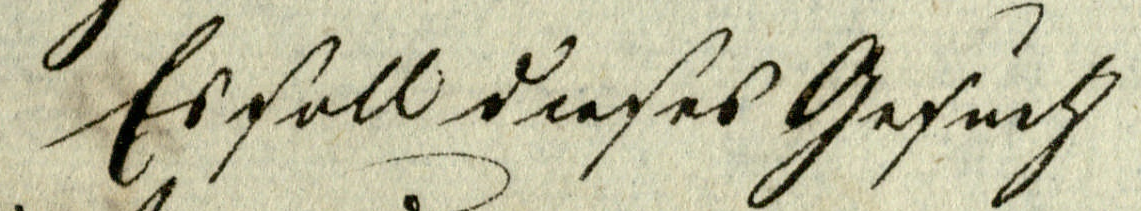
Es soll dieses Gesuch
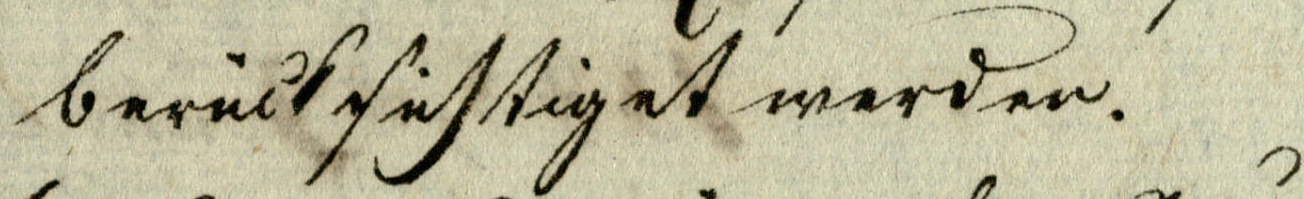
berücksichtiget werden.
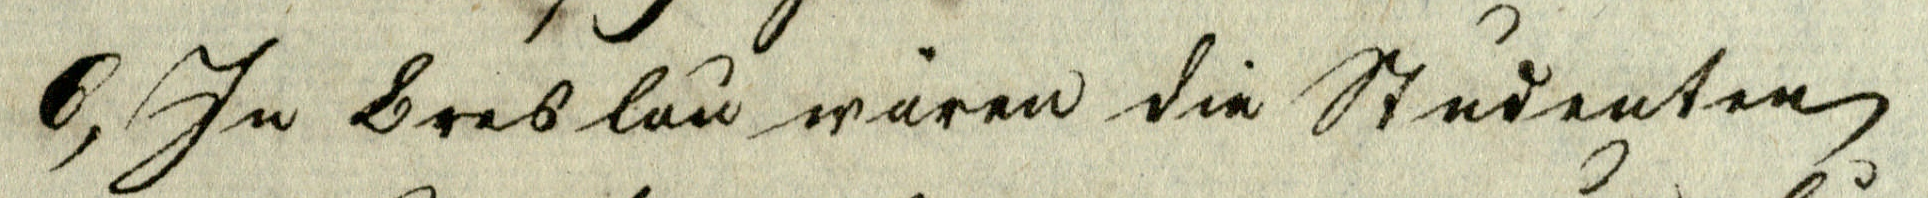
6, In Breslau wären die Studenten
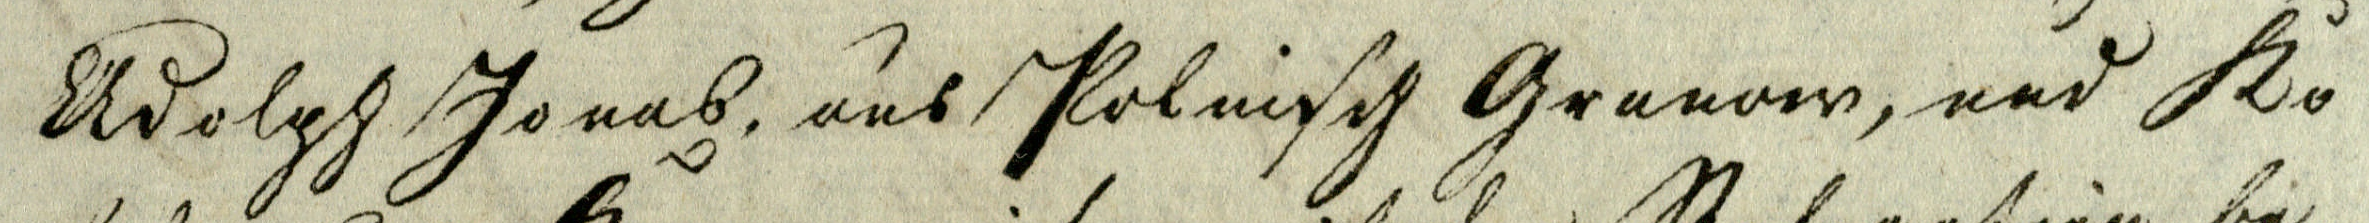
Adolph Jonas, aus Polnisch Granow, und Ko¬
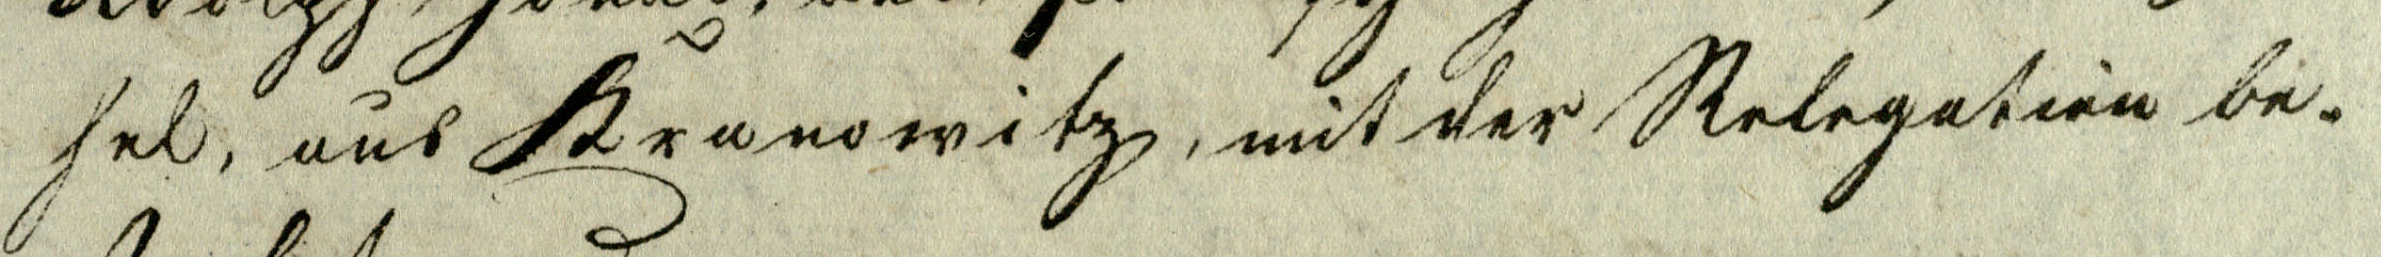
hel, aus Kranowitz, mit der Relegation be¬
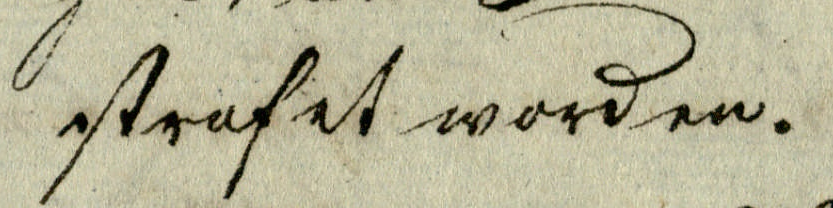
strafet worden.
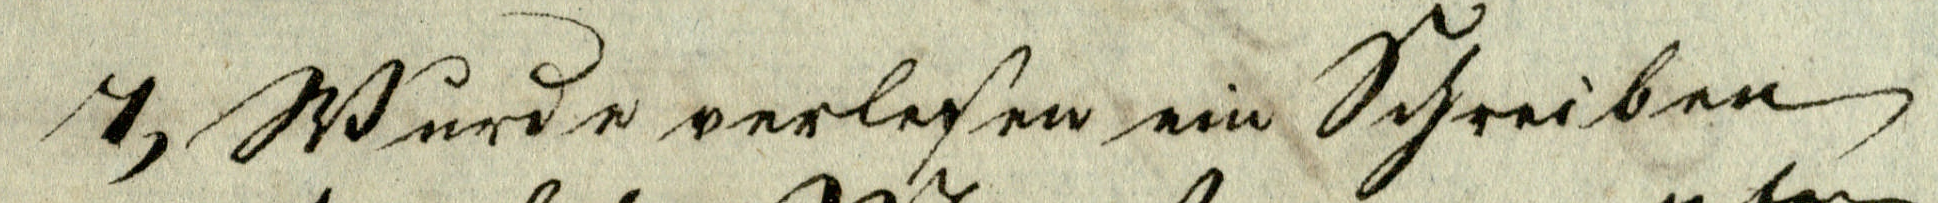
7, Wurde verlesen ein Schreiben
